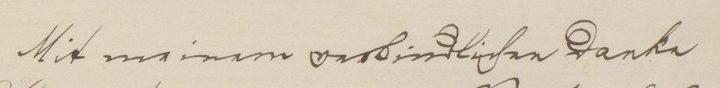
Mit meinem verbindlichen Danke
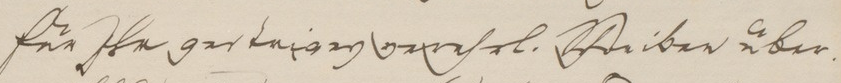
für Ihr gestriges verehrl. Schreiben über-
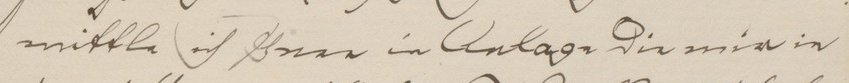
mittle ich Ihnen in Anlage die mir in
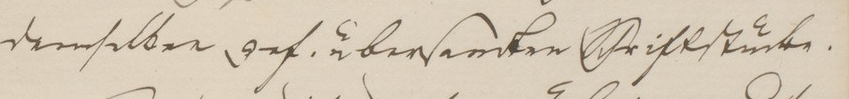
demselben gef. übersandten Schriftstücke.
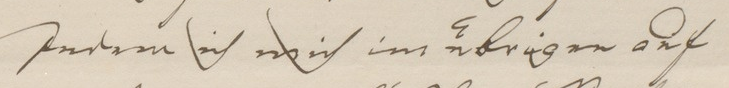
Indem ich mich im übrigen auf
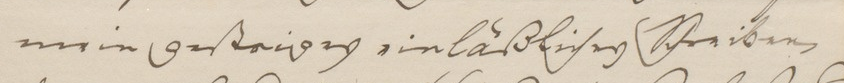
mein gestriges einläßliches Schreiben
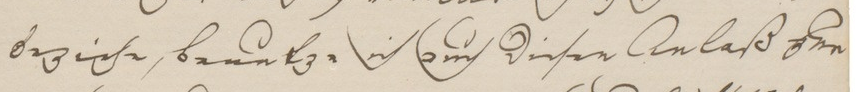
beziehe, benutze ich auch diesen Anlaß zur
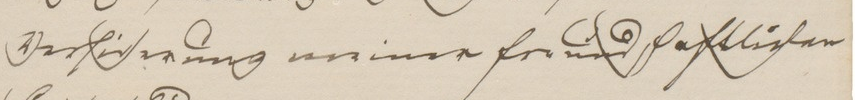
Versicherung meiner freundschaftlichen
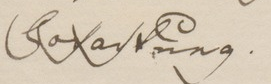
Hochachtung
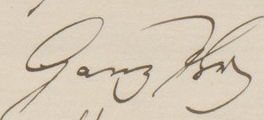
Ganz Ihr
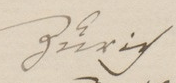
Zürich
